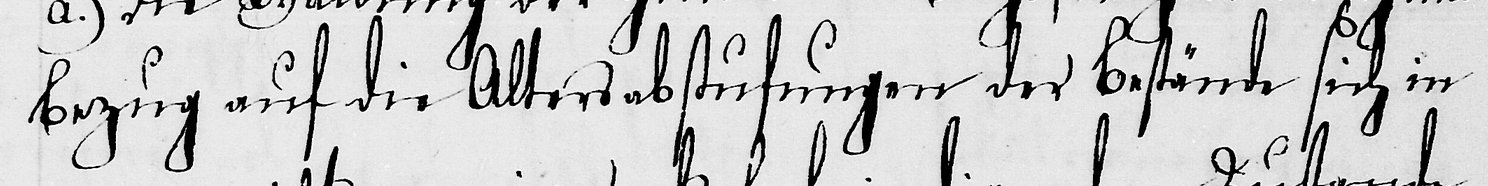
Bezug auf die Altersabstufungen der Bestände sich in
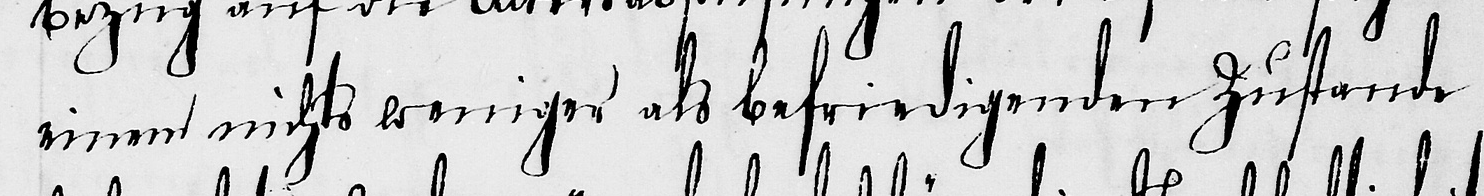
einem nicht weniger als befriedigenden Zustande
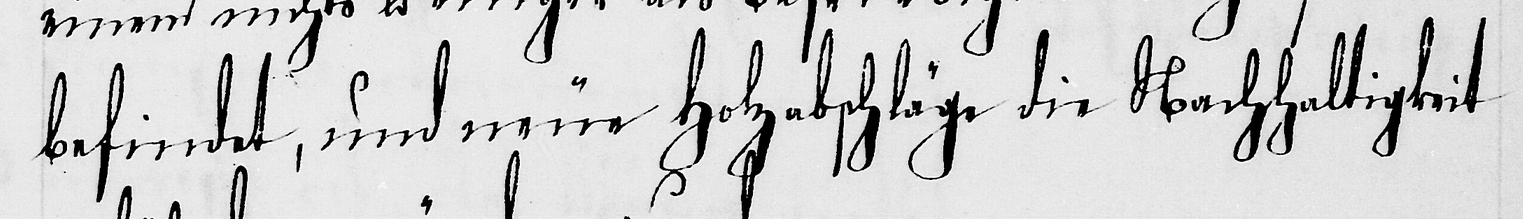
befindet, und neue Holzabschläge die Nachhaltigke¬
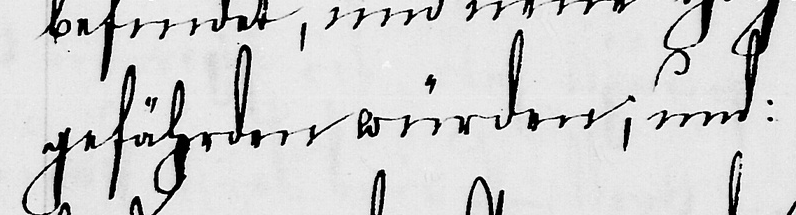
gefährden würden, und:
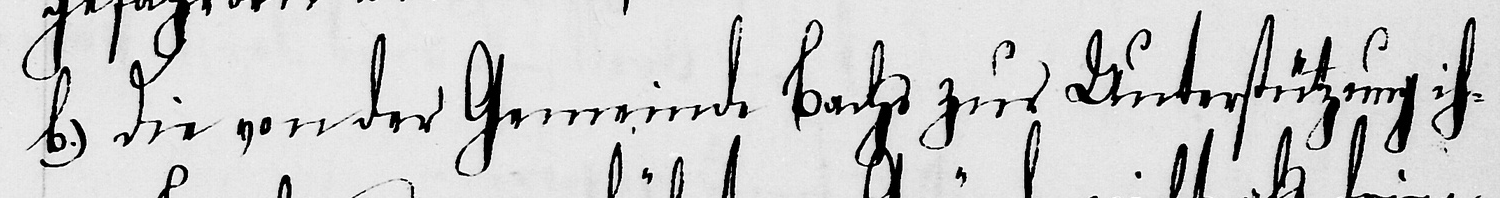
b.) Die von der Gemeinde Bachs zur Unterstützung i¬
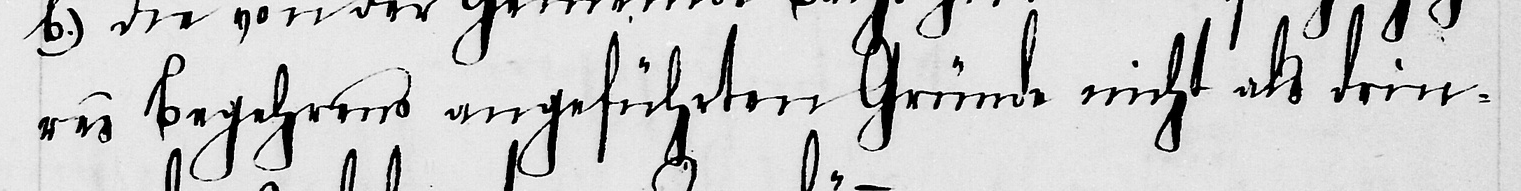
hres Begehrens angeführten Gründe nicht als drin¬
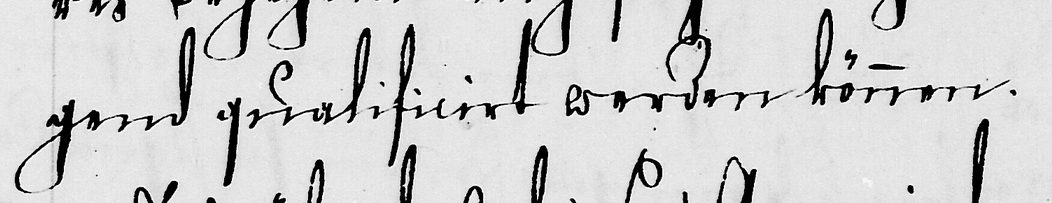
gend qualificirt werden können.
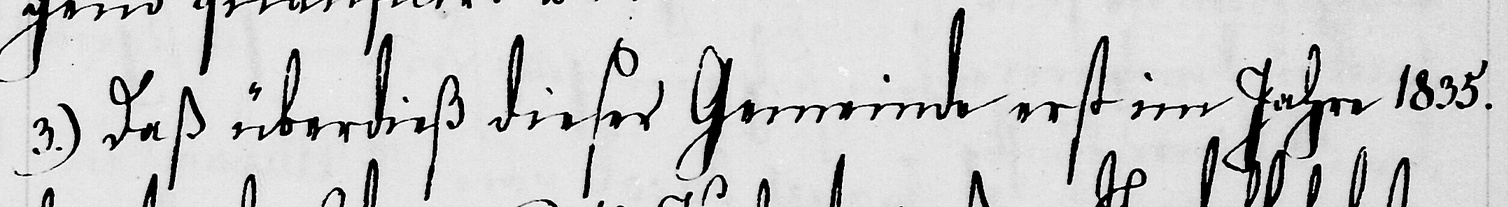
3.) Daß überdieß dieser Gemeinde erst im Jahre 1835.
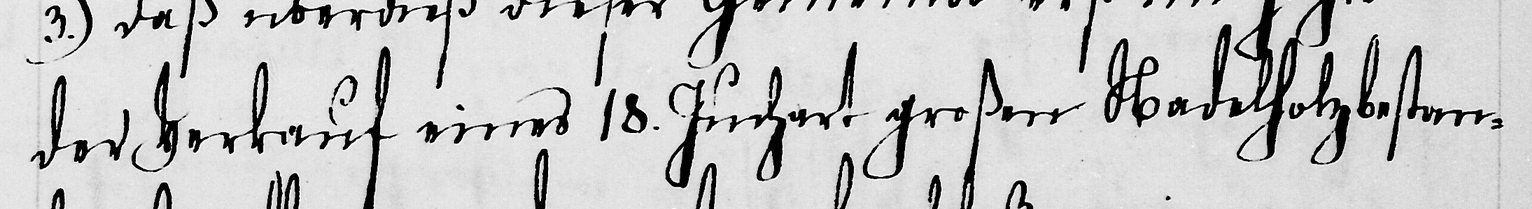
der Verkauf eines 18. Juchart großen Nadelholzbestan¬
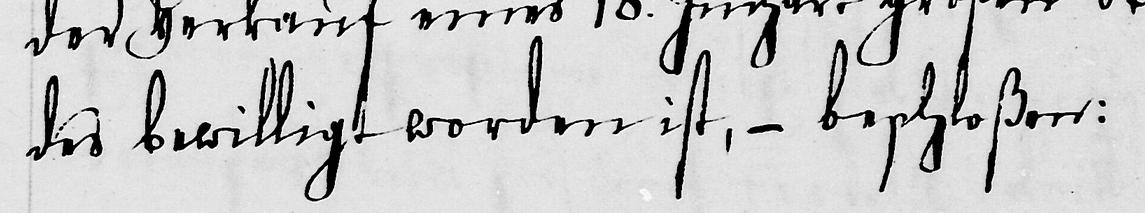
des bewilligt worden ist, – beschlossen:
